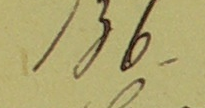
136
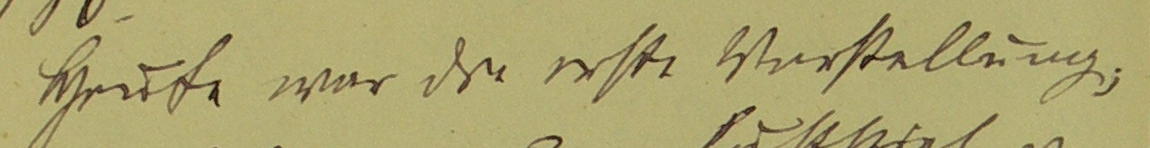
heute war die erste Vorstellung;
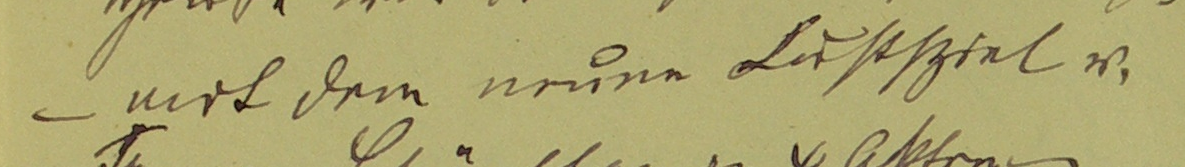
- mit dem neuen Lustspiel von
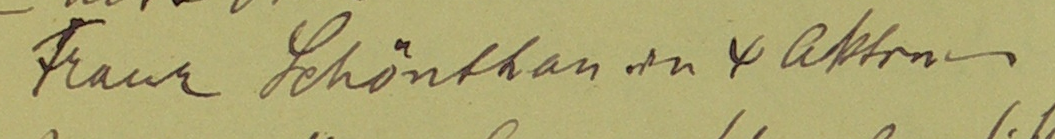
Franz Schönthan in 4 Akten.
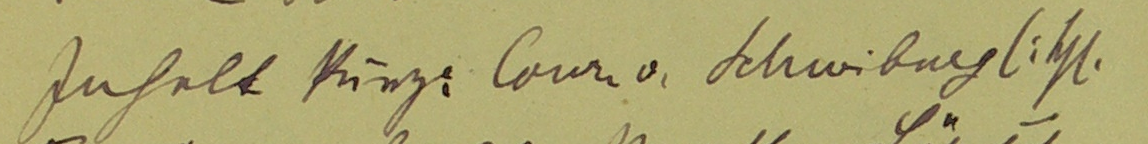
Inhalt kürz: Couno von Schwiburg (:H.
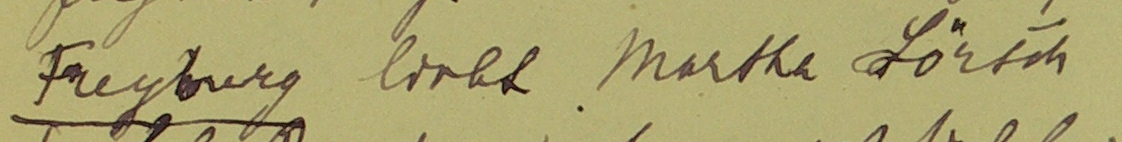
Freyburg :) liebt Martha Lörsch
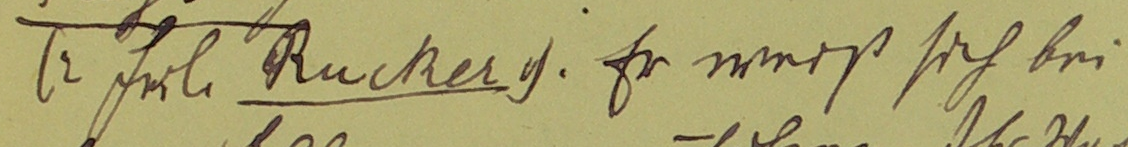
(:Frl. Rucker: ). Er weiß sich bei
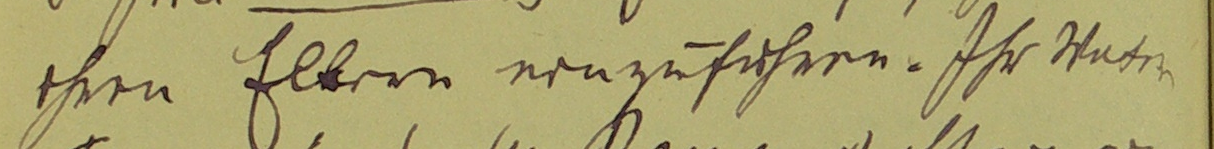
ihren Eltern einzuführen. Ihr Vater
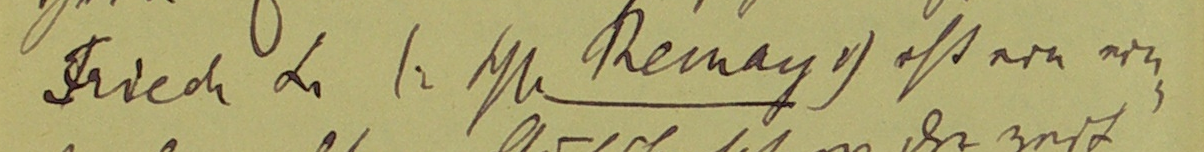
Fried. Li. ( :H. Remay :) ist ein
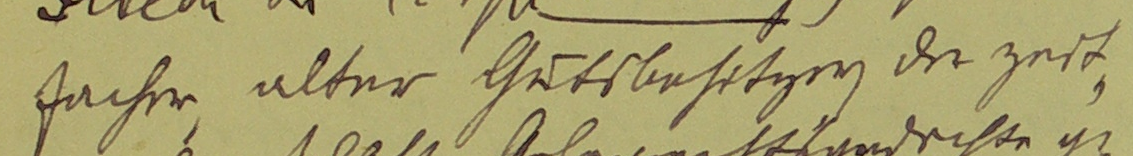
Jahre alter Gutsbesitrzer der zeit¬
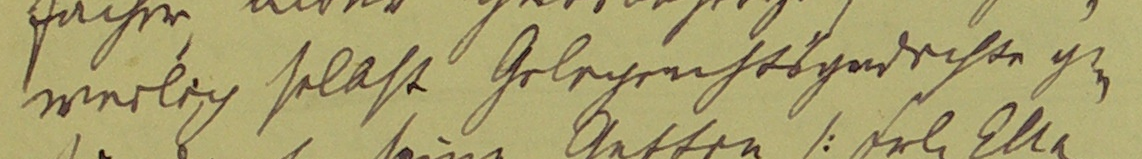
weilig selbst Gelegenheitsgedichet ge¬
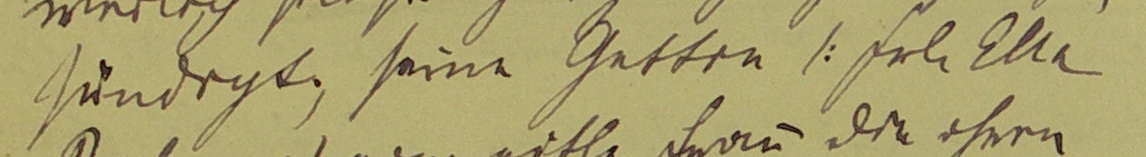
sündigte, seine Gattin (: Frl. Ella
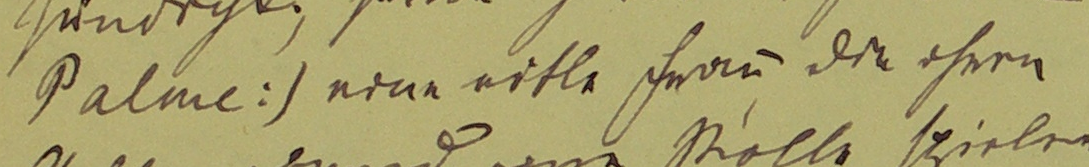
Palme: ) eine eitle Frau die ihren
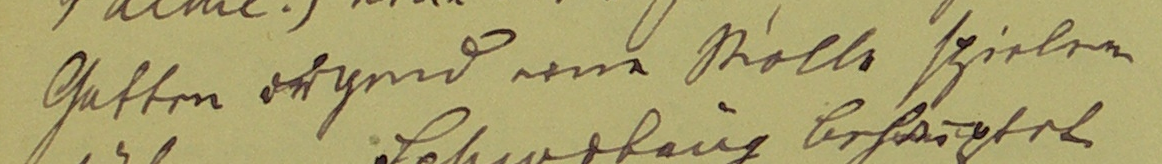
Gatten irgend eine Rolle spielen
